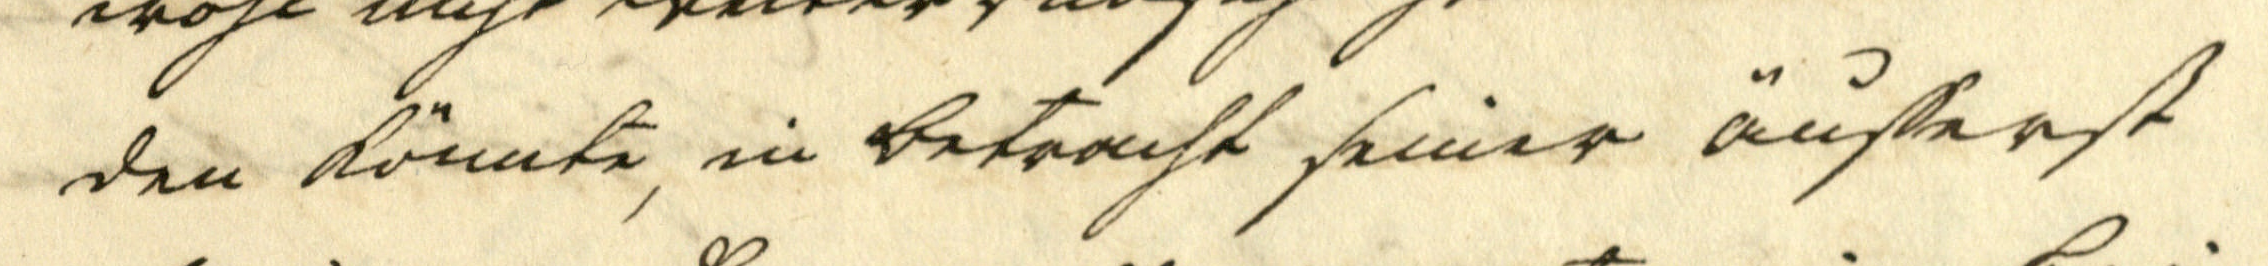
den könnte, in Betracht seiner äusserst
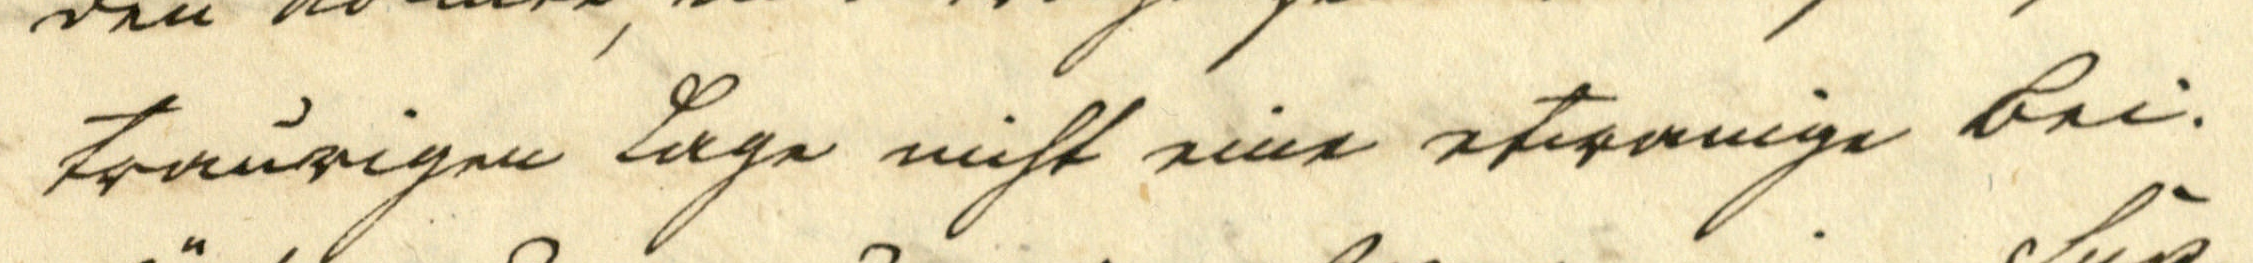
traurigen Lage nicht eine etwanige Bei¬
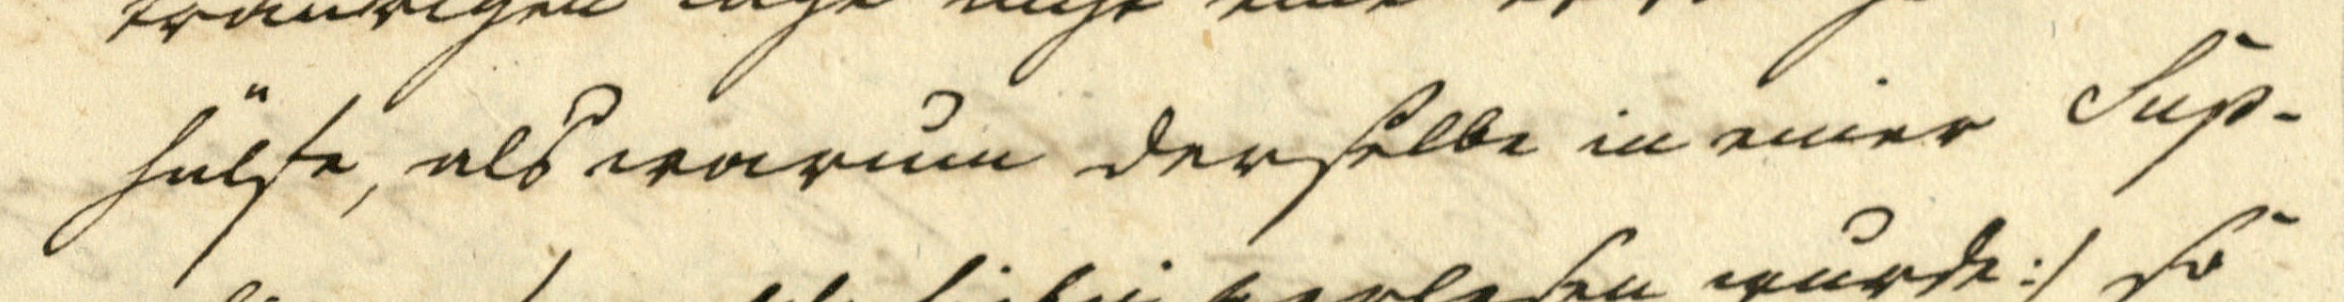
hülfe, als warum derselbe in einer Sup¬
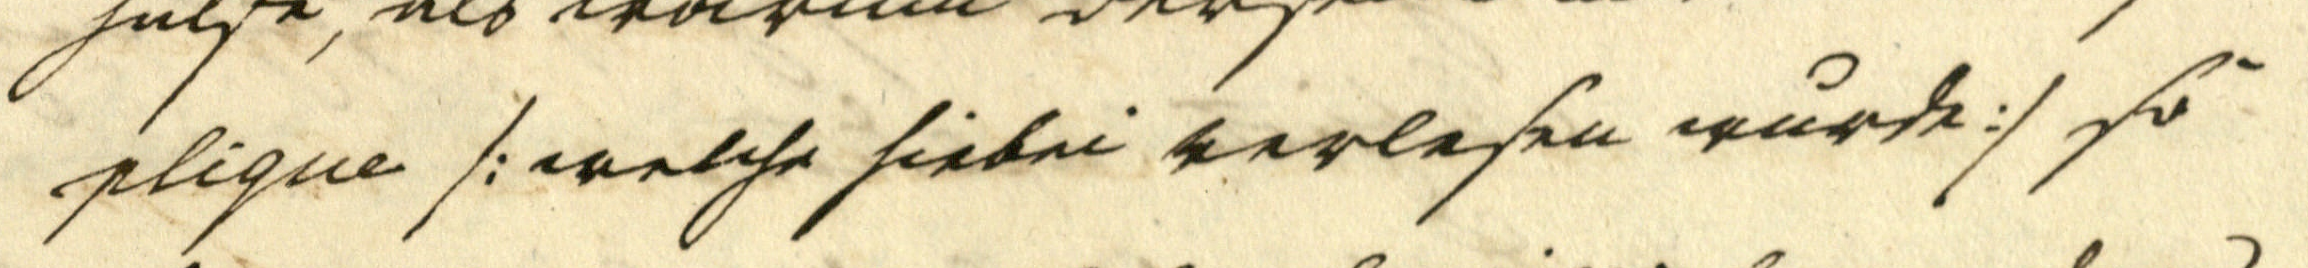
plique /. welche hiebei verlesen wurde:/ so
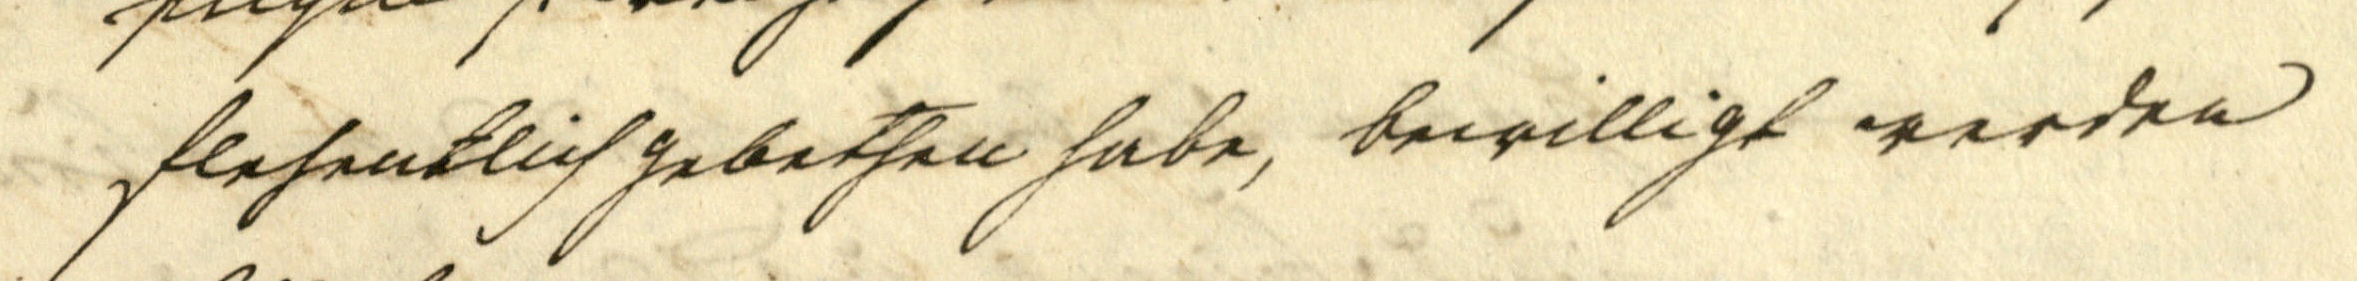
flehentlich gebethen habe, bewilligt werden
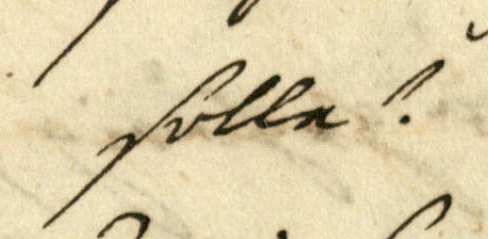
solle?
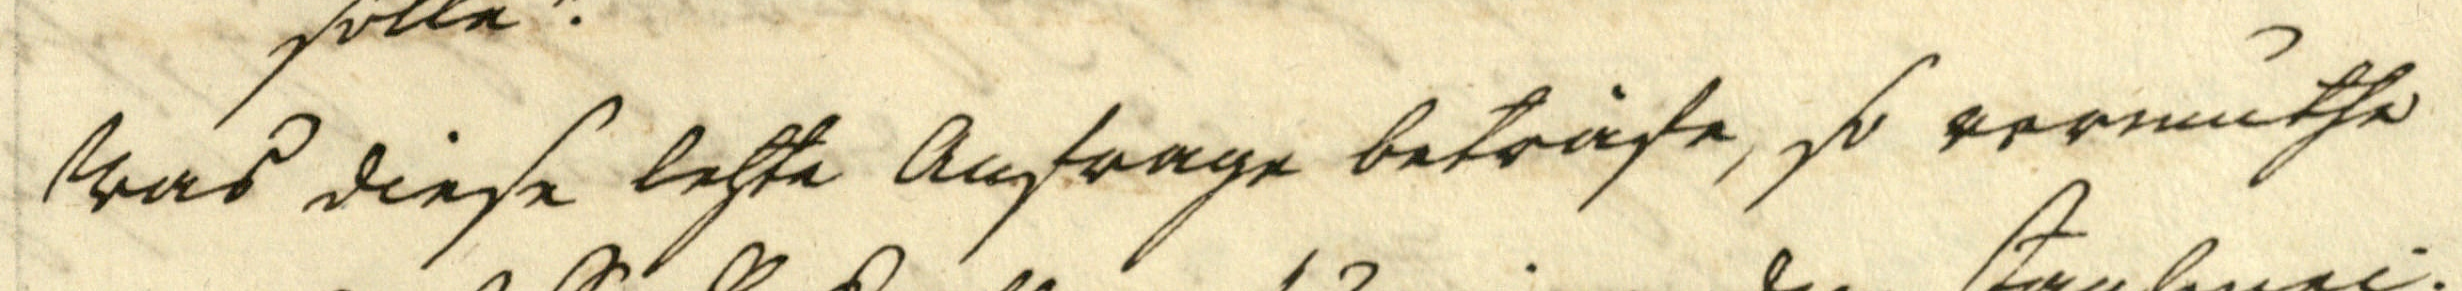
Was diese letzte Anfrage beträfe, so vermuthe
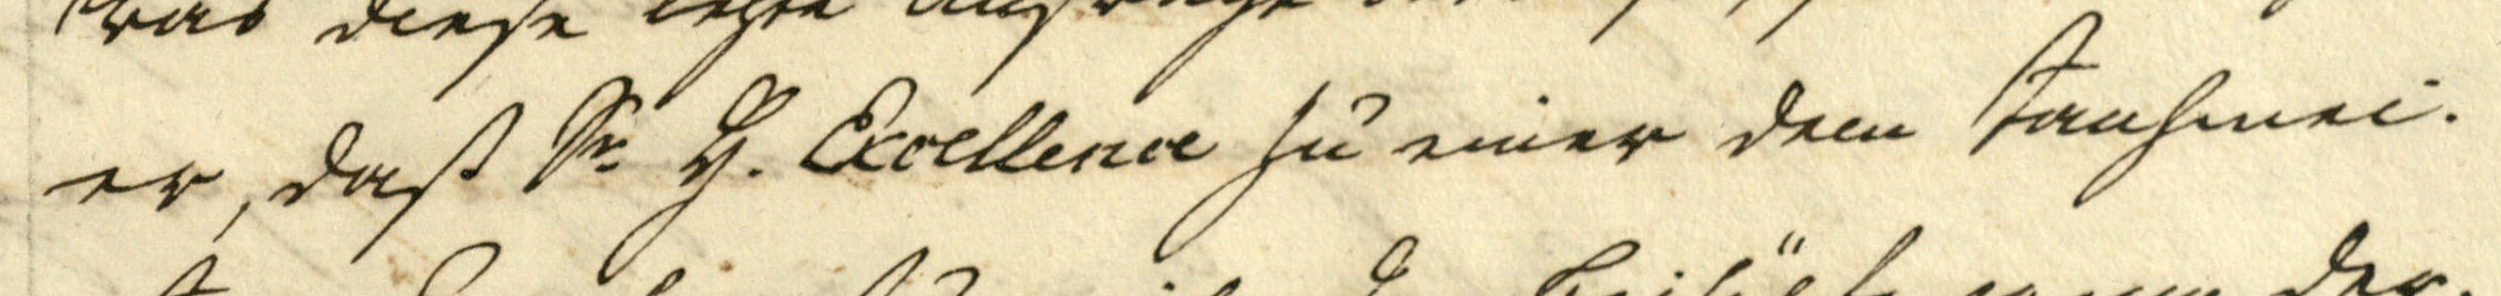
er, daß Sr H. Excellence zu einer dem Tanzmei¬
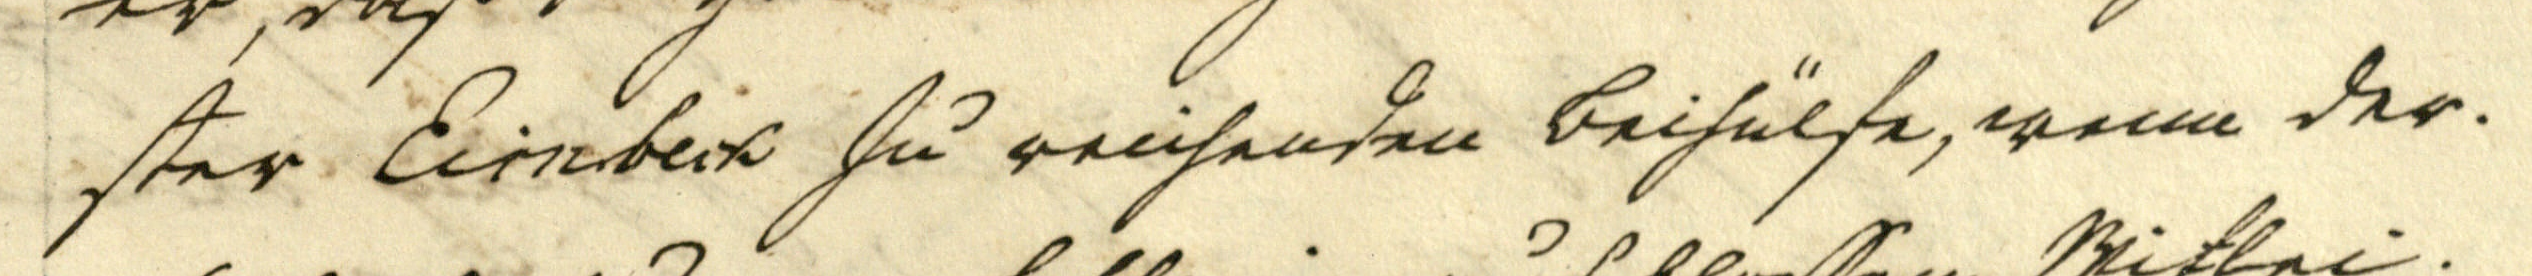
ster Eimbeck zu reichenden Beihülfe, wenn der¬
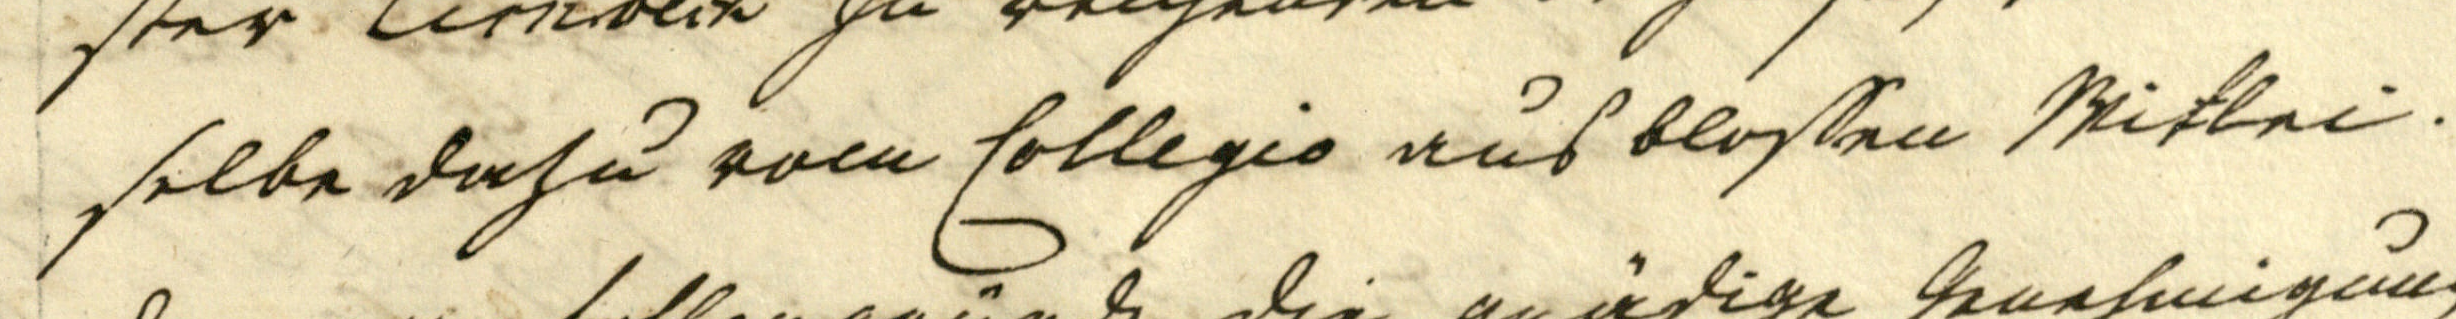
selbe dazu vom Collegio aus blossen Mitlei¬
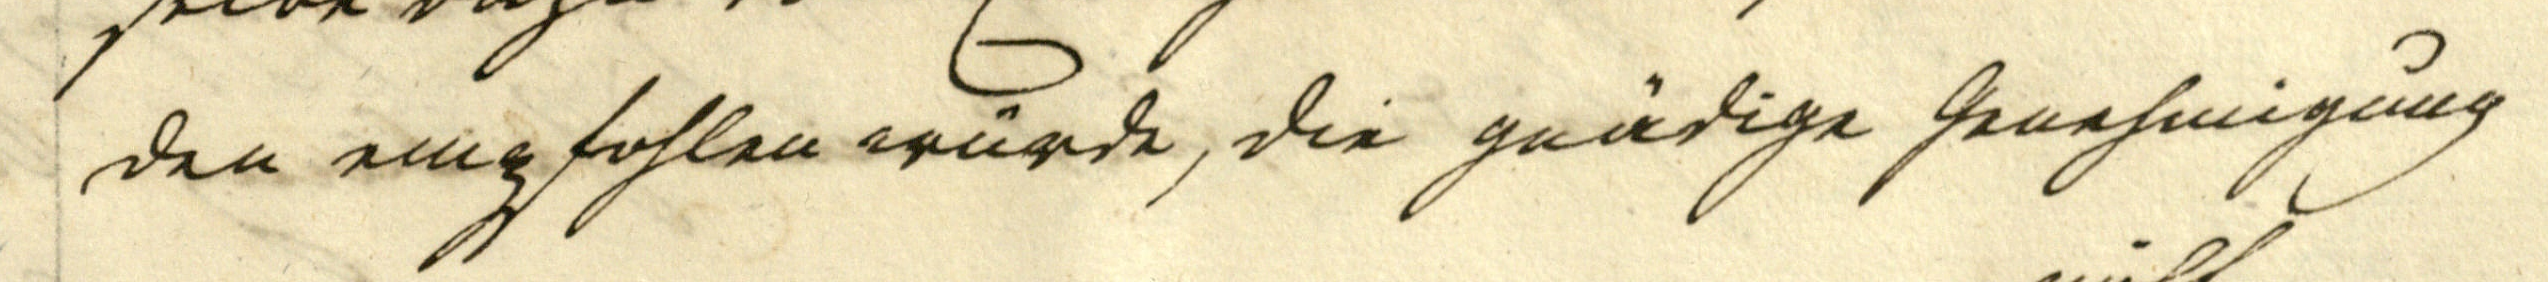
den empfohlen würde, die gnädige Genehmigung
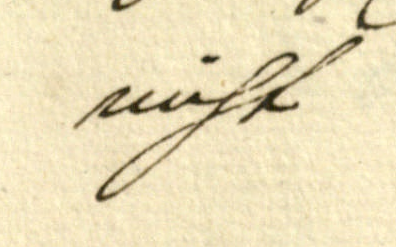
nicht
